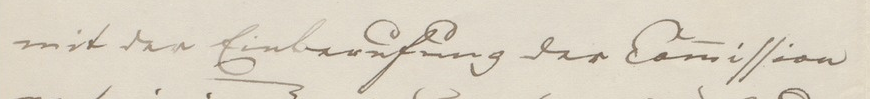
mit der Einberufung der Commission
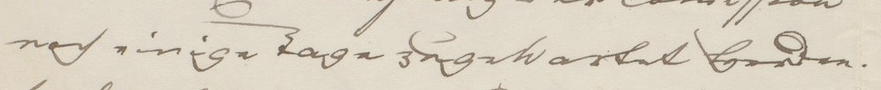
noch einige Tage zugewartet werden.
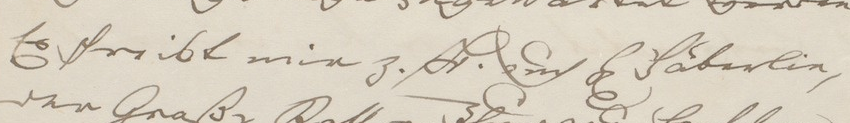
Es schreibt mir z. B. auch H Häberlin,
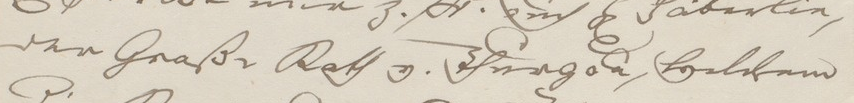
der Große Rath v. Thurgau, welchem
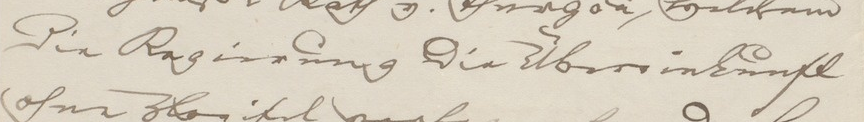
die Regierung die Übereinkunft
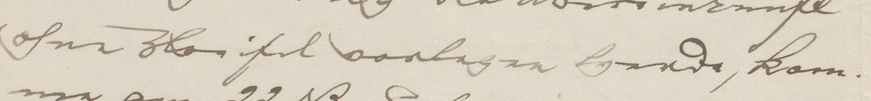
ohne Zweifel vorlegen werde, kom-
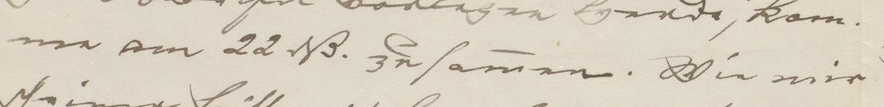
me am 22 dß. zusammen. Wie mir
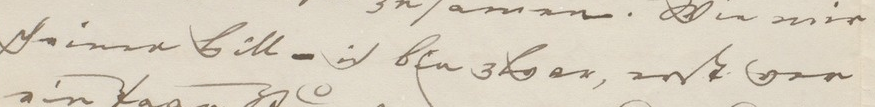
scheinen will – ich bin zwar, erst vor
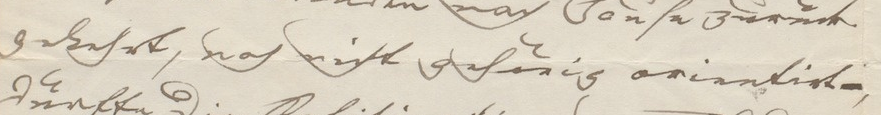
gekehrt, noch nicht gehörig orientirt –,
